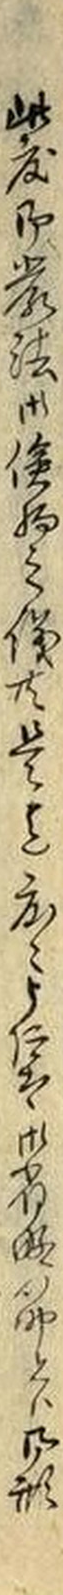此度御厳法御倹約之儀共是迄度々被仰出候御省略筋とハ御形
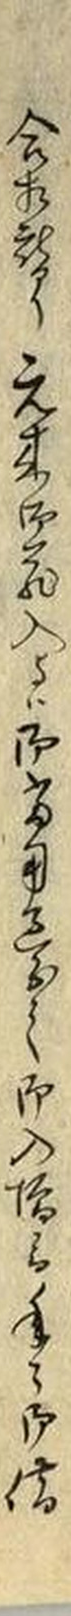合相替り元来御蔵入与ハ御当用過分之御入増ニ而年々御借
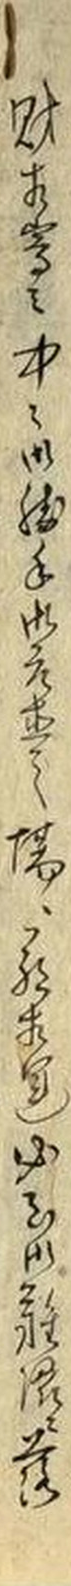財相嵩ミ中々御勝手御取直之場へ難相運必至御難渋ニ落
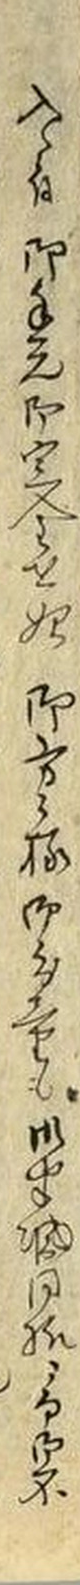入候ニ付御手元御定金を始御方々様御分量も御半減同様ニ而御不
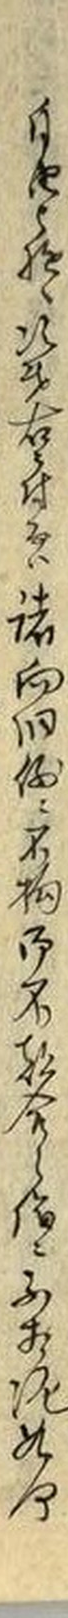自由被遊候次第右ニ付而ハ諸向旧例ニ不拘御不都合之儀ニ不相泥如何
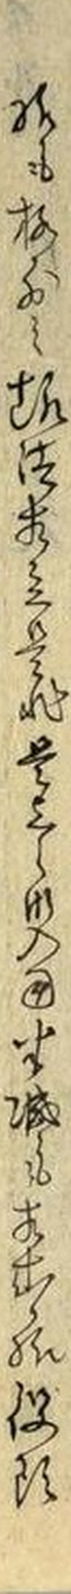様二も格別之趣法相立是非是迄之御入用半減ニも相成候様役頭
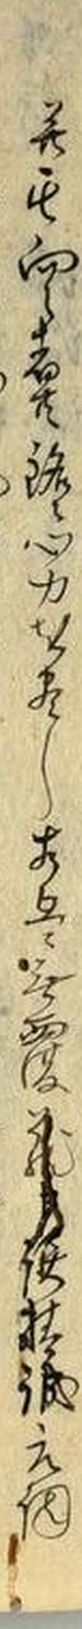并其向之者共銘々心力を尽し相互ニ無覆蔵精誠取調
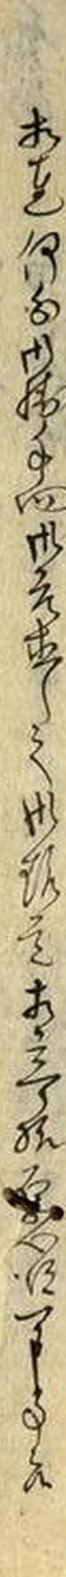相達何分御勝手向御取直し之御趣意相立候様厚心得可申事ニ候
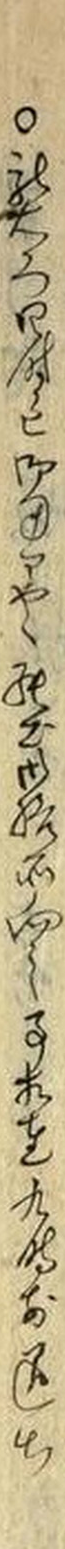〇新右衛門四時過御用部やへ罷出御膳所向之事相達九時前退出
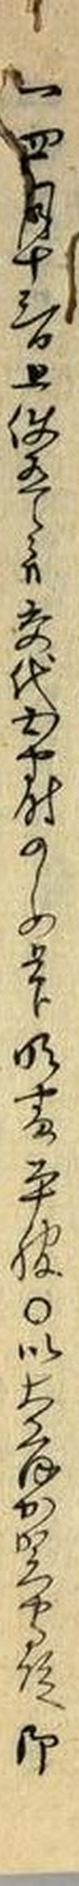一四月十三日上使有之ニ付交代五半時のしめ上下明番平服〇以大久保加賀守殿御
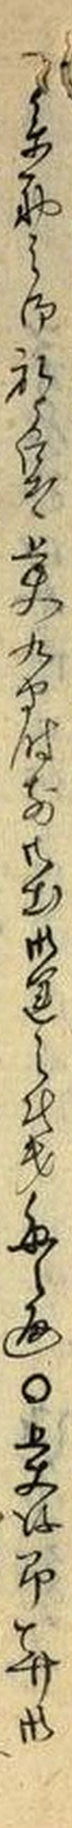参勤之御礼仰出候上使九半時前御出御運之次第毎之通〇上使後即刻御
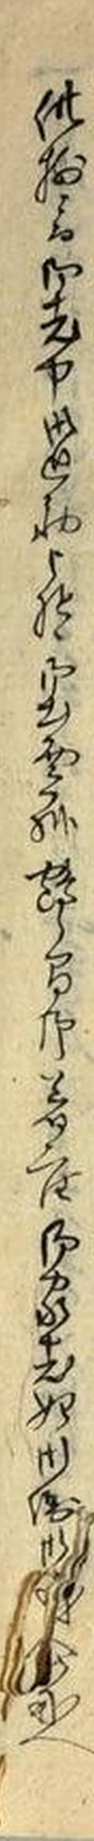供揃ニ而御老中御廻勤被遊候御出殿掛鶴之間御着座御家老始御側御用人御用人
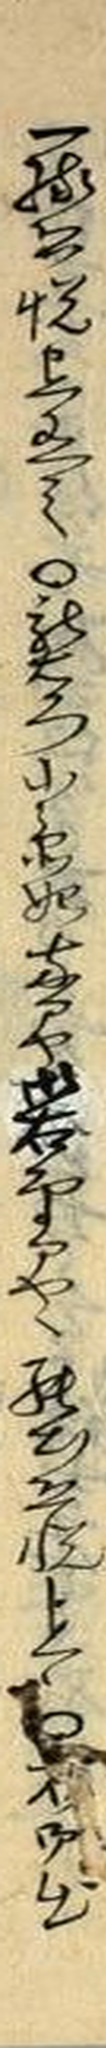一統恐悦申上有之〇新右衛門小兵衛始両部ヤ御右筆部ヤへ罷出恐悦申上候○御出
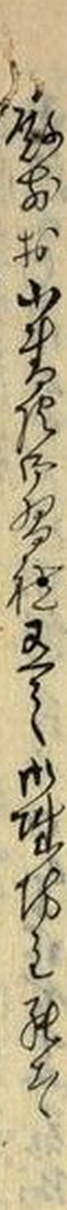殿前於小書院御習礼有之御城坊主罷出候
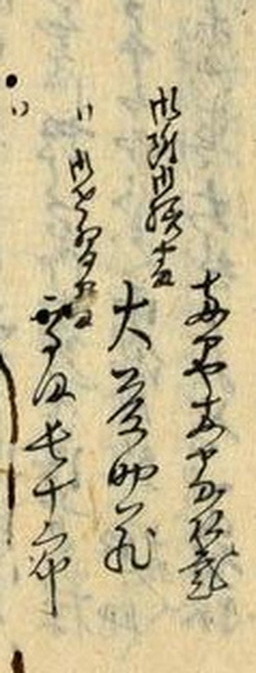御附御膳番大藤助蔵
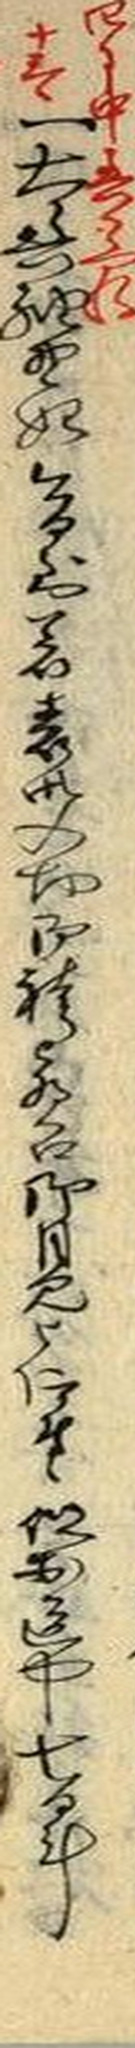一大奥袖野始今日到着表御〆切御袴被為召御目見被仰付候但於道中七日斗
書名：少傅日録抄（斉承付側向頭取日記、在府）
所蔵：福井県文書館 Fukui Prefectural Archives
